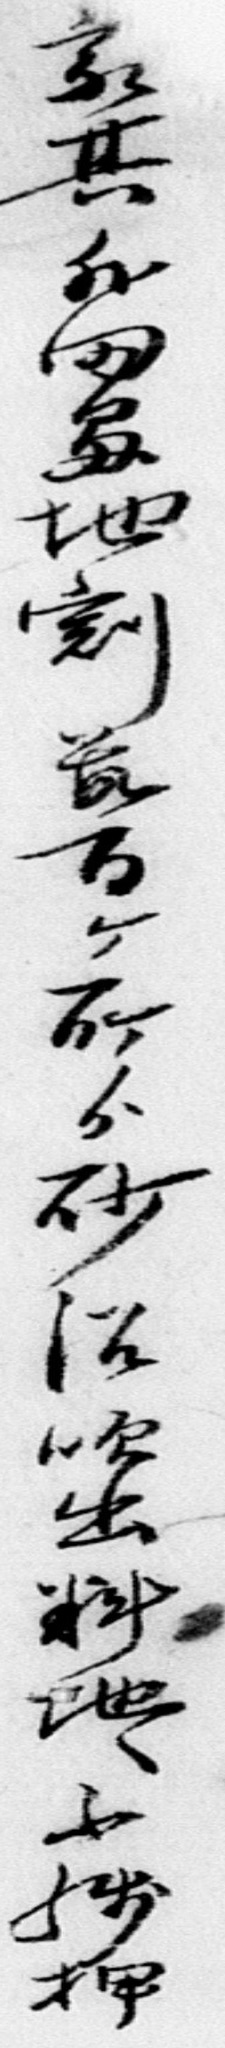家其外田畠地割数百ケ所ゟ砂泥吹出料地へ不残押
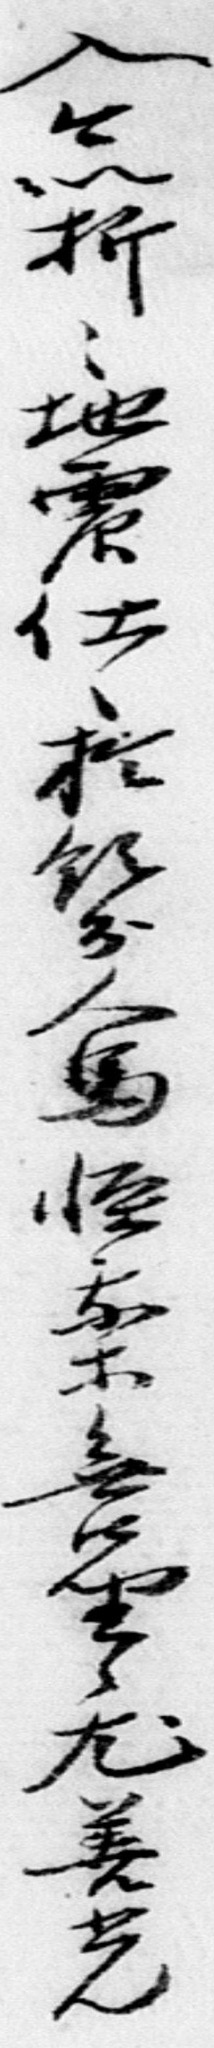入今以折々地震仕候於領分人馬怪我等無御座候尤善光
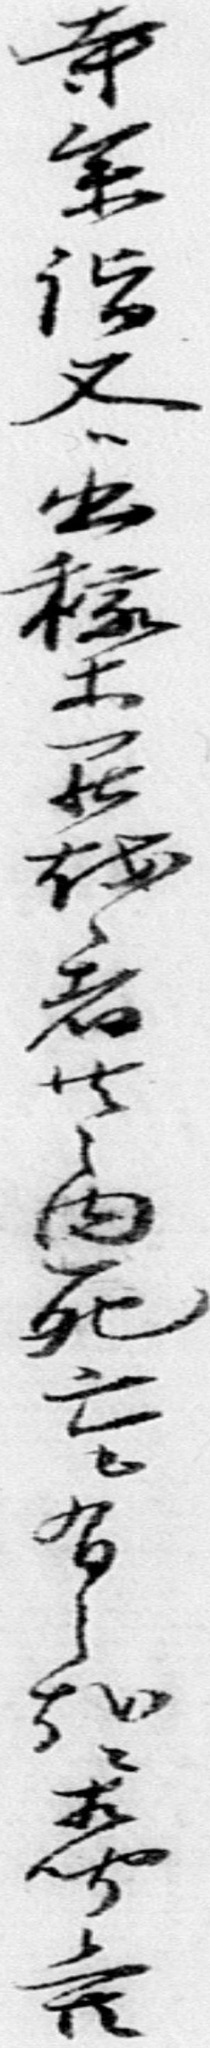寺参詣又は出稼等罷越候者共之内死亡も有之哉に相聞候へ共
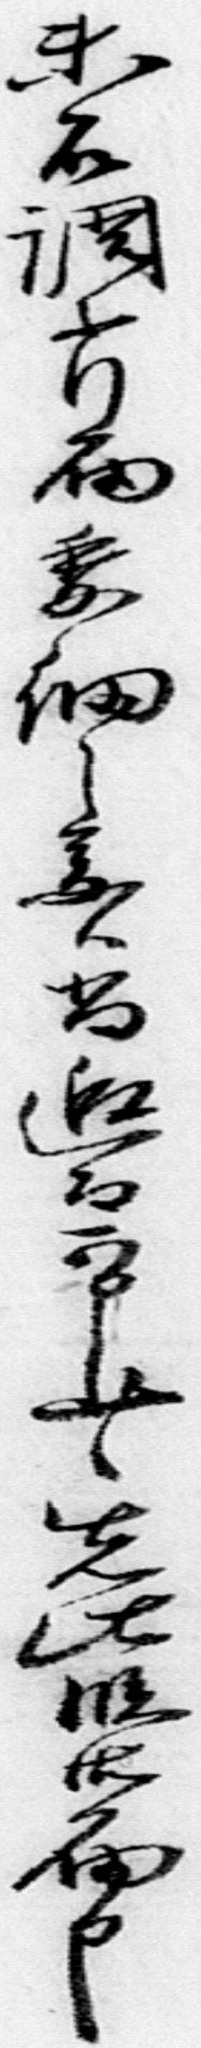未取調不行届委細之義は追而可申上候先此段御届申
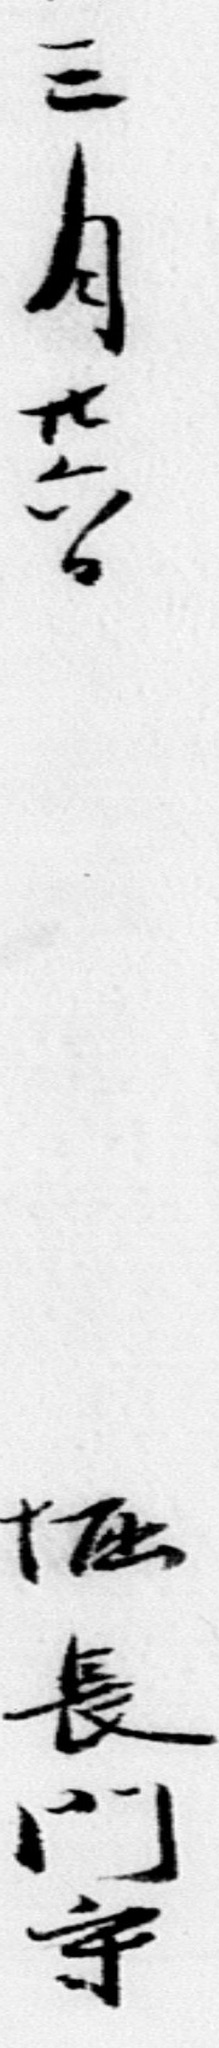三月廿六日堀長門守
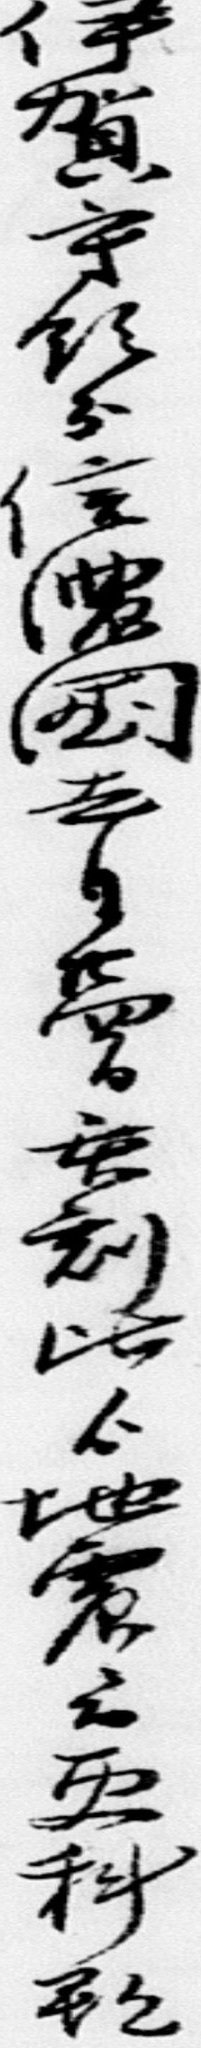伊賀守領分信濃国去月廿四日亥刻頃ゟ地震に而更科郡
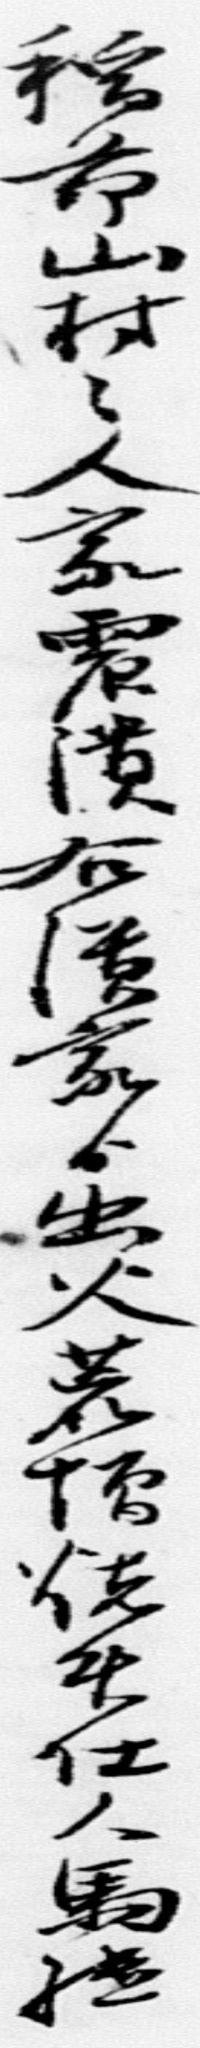稲荷山村々人家震潰右潰家ゟ出火荒増焼失仕人馬継
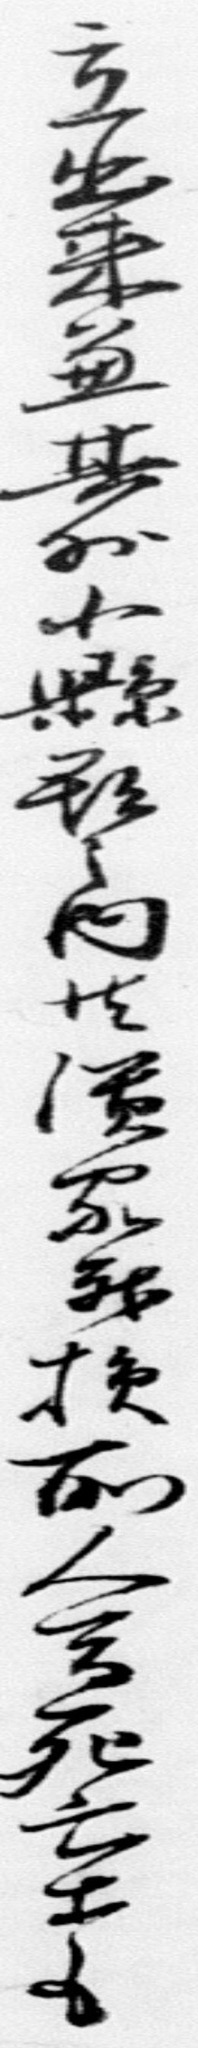立出来兼其外小縣郡之内共潰家幷損所人馬死亡等も
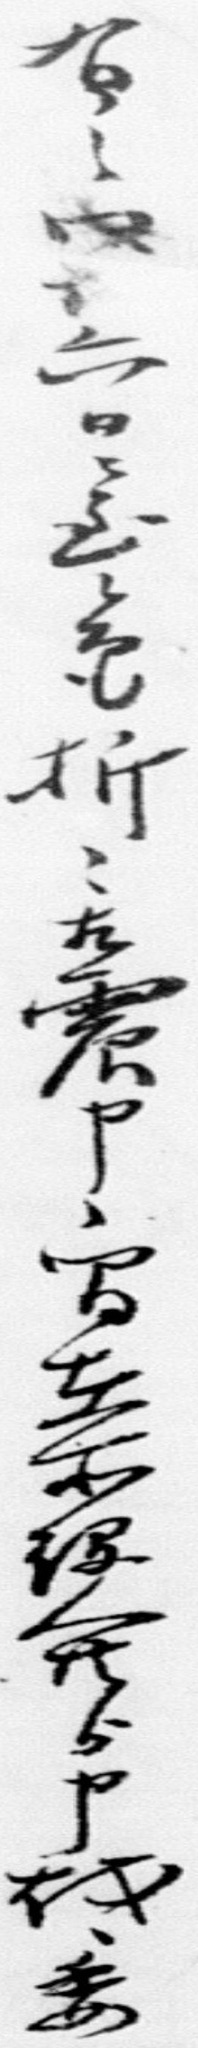有之由廿六日に至候而も折々相震申候間在所役人共ゟ申越候委
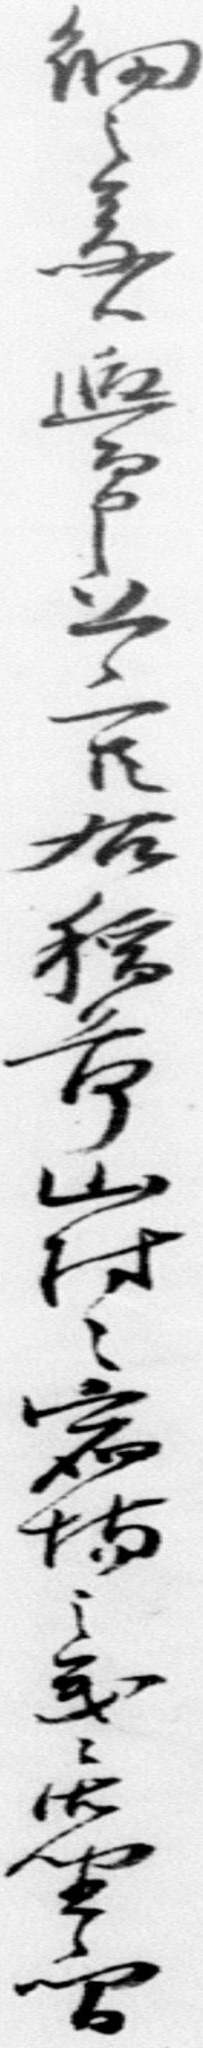細之義は追而申上候へ共右稲荷山村々宿坊之義に御座候間
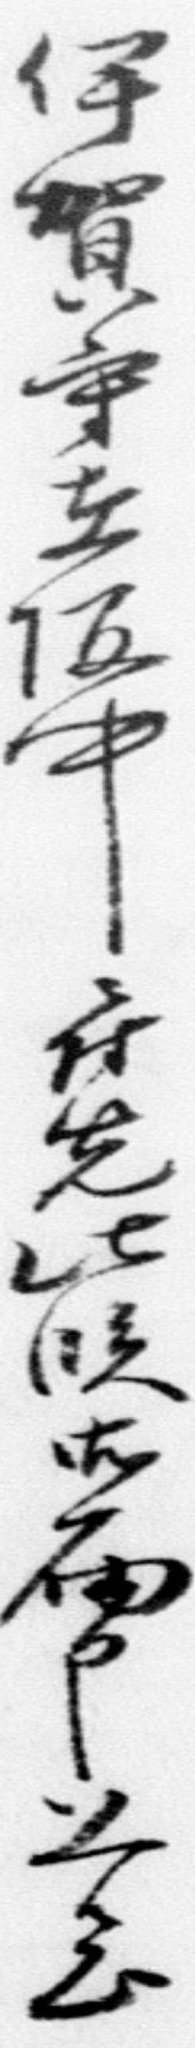伊賀守在坂中に付先此段御届申上候以上
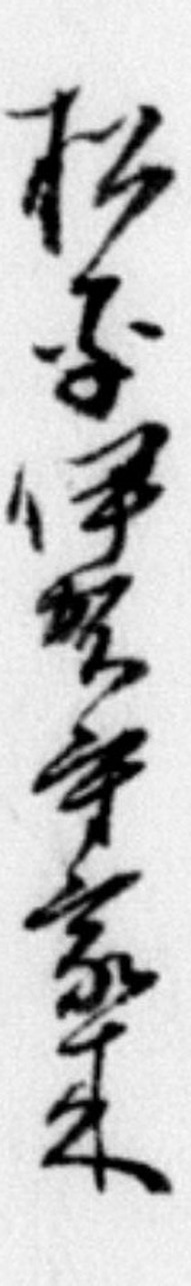松平伊賀守家来
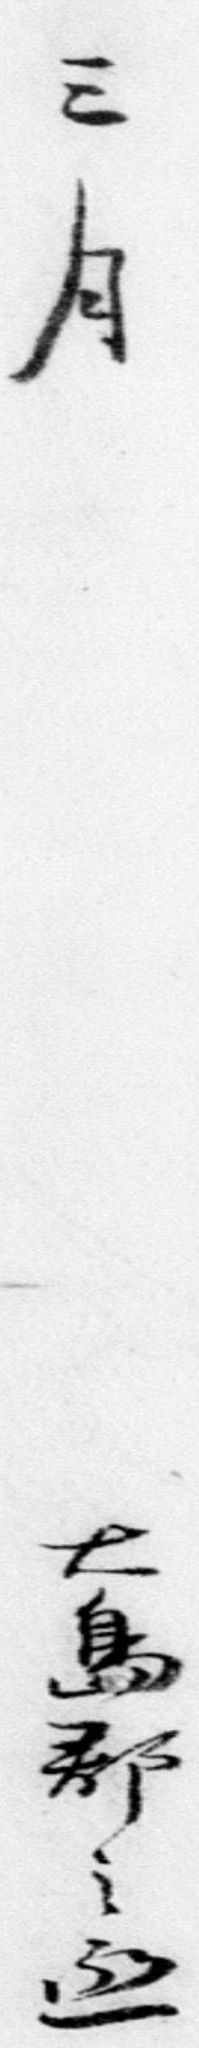三月大島郡之丞
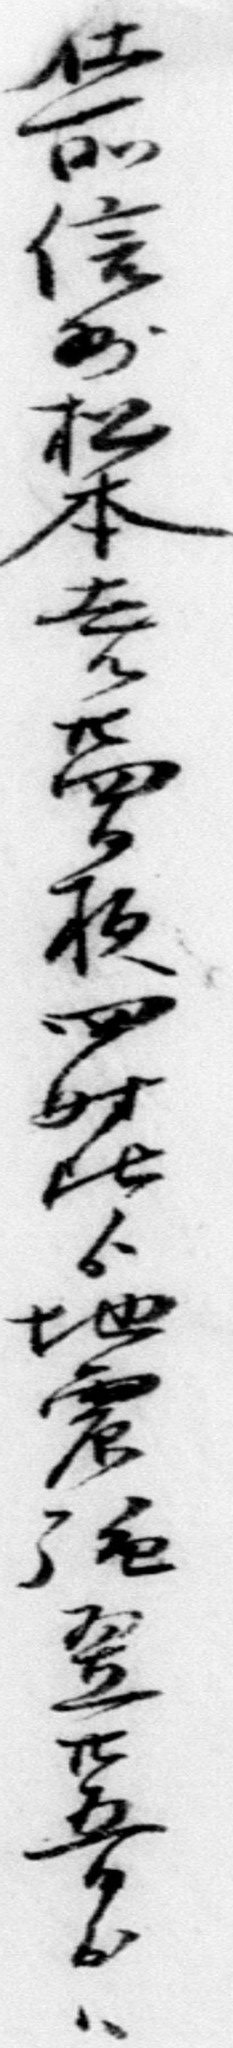在所信州松本去る廿四日夜四時頃ゟ地震強廿五日ゟは
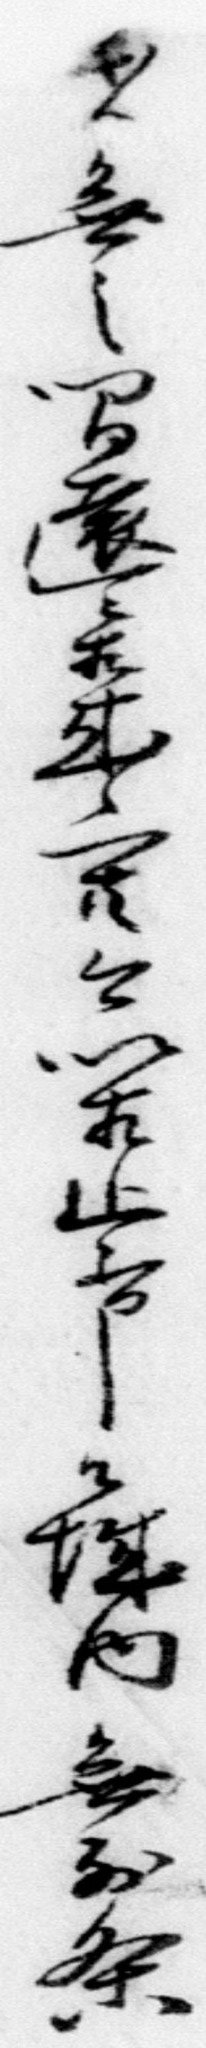義は無之間遠に相成候へ共今以相止不申候城内無別条

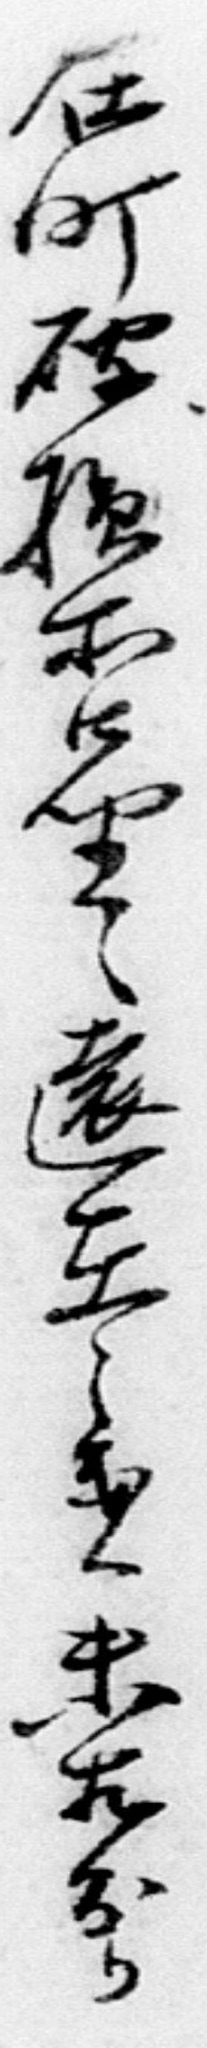在町破損所御座候遠在之義は未相分り
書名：信州大地震一件
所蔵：徳島県立図書館
